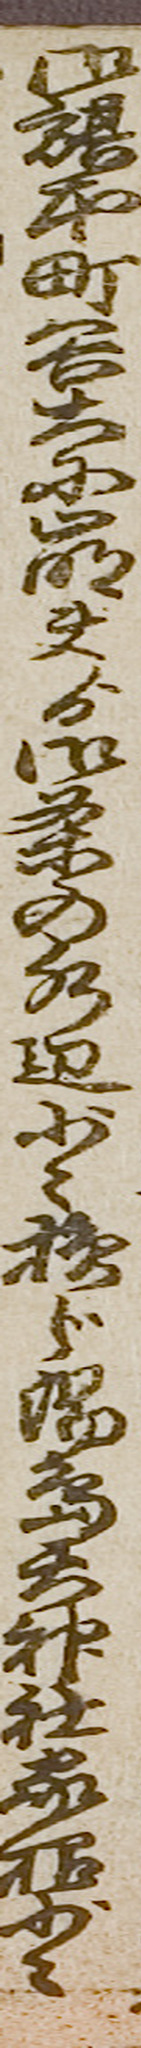御旗本町谷大に崩夫ゟ御茶の水辺少々損じ湯島天神社家根少々
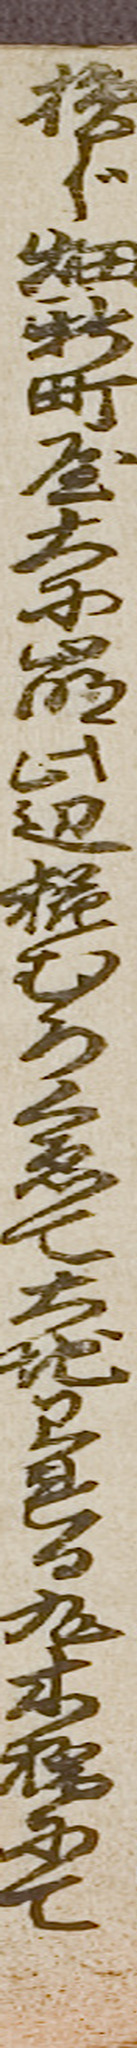損じ畑新町屋大に崩此辺糀むろくゑて大地われる丸木橋にて
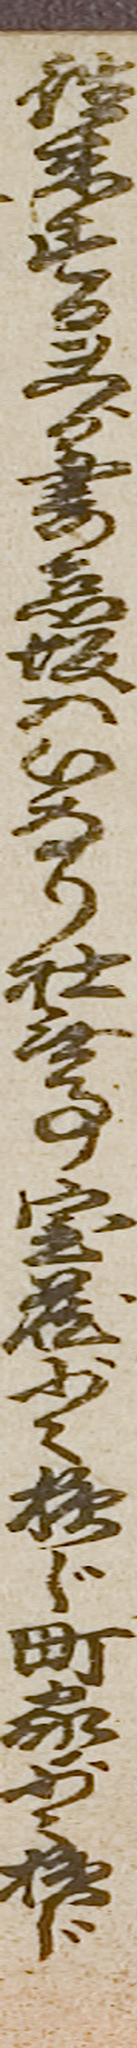往来する夫ゟ妻恋坂はいなり社無事宝蔵少々損じ町家少々損じ
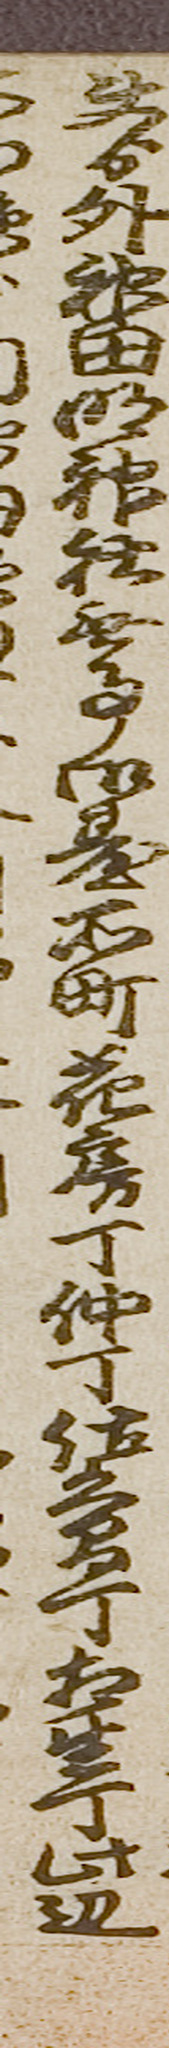夫ゟ外神田明神社無事御台所町花房丁仲丁佐久間丁相生丁此辺
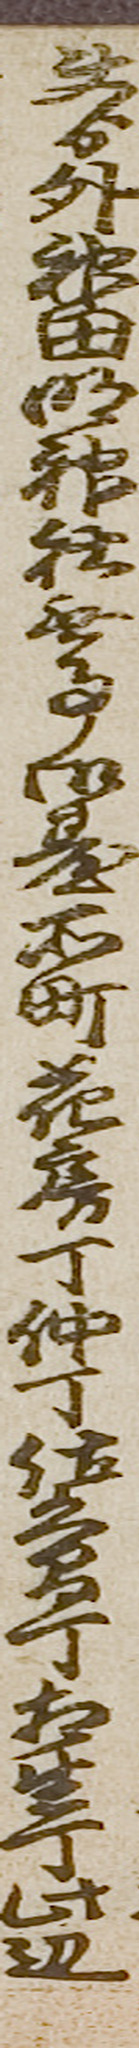夫ゟ外神田明神社無事御台所町花房丁仲丁佐久間丁相生丁此辺
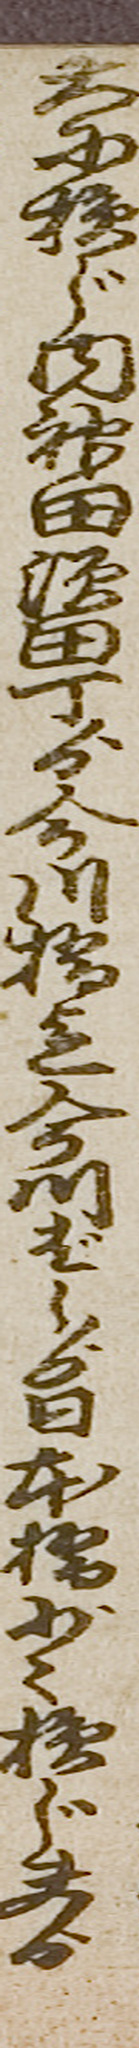大に損じ内神田須田丁ゟ今川橋迄今川ばしゟ日本橋少々損じ夫ゟ
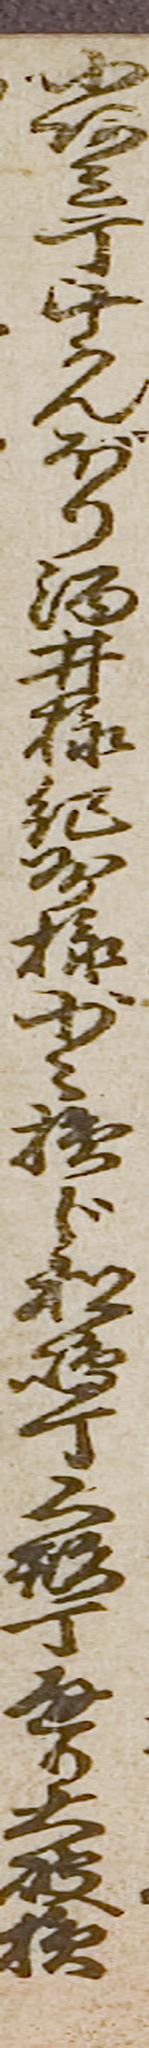小あみ丁十けんぼり酒井様紀州様少々損じ松島丁人形丁通り大破損
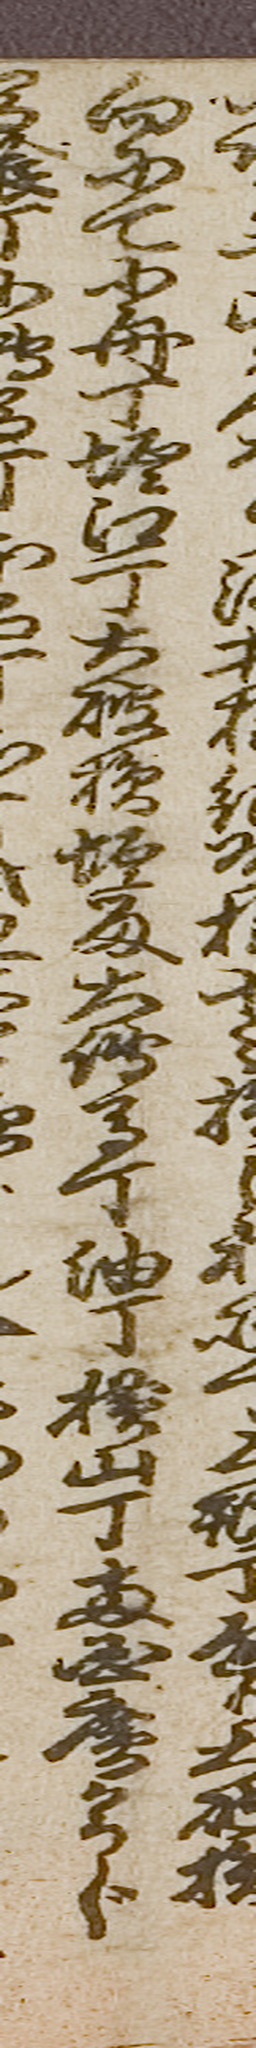向にて小舟丁堀江丁大破損掘留大伝馬丁油丁横山丁両国広かうじ
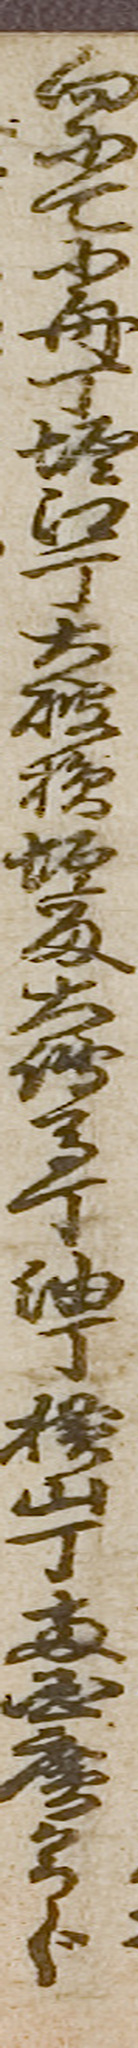向にて小舟丁堀江丁大破損掘留大伝馬丁油丁横山丁両国広かうじ
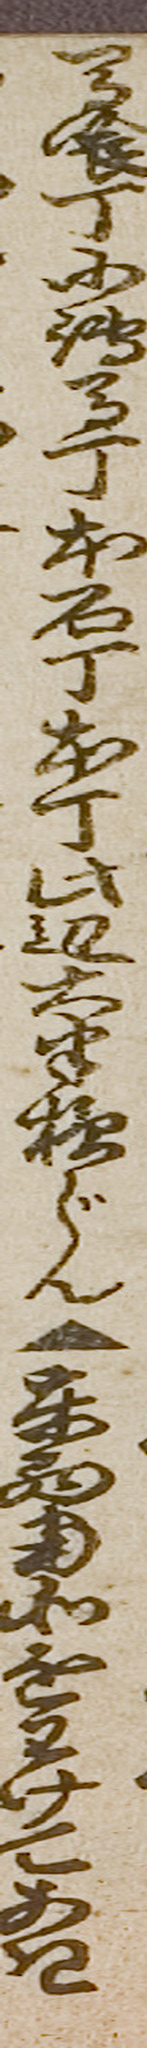馬喰丁小伝馬丁本石丁本丁此辺大半損じる▲東西南北をわけてあき
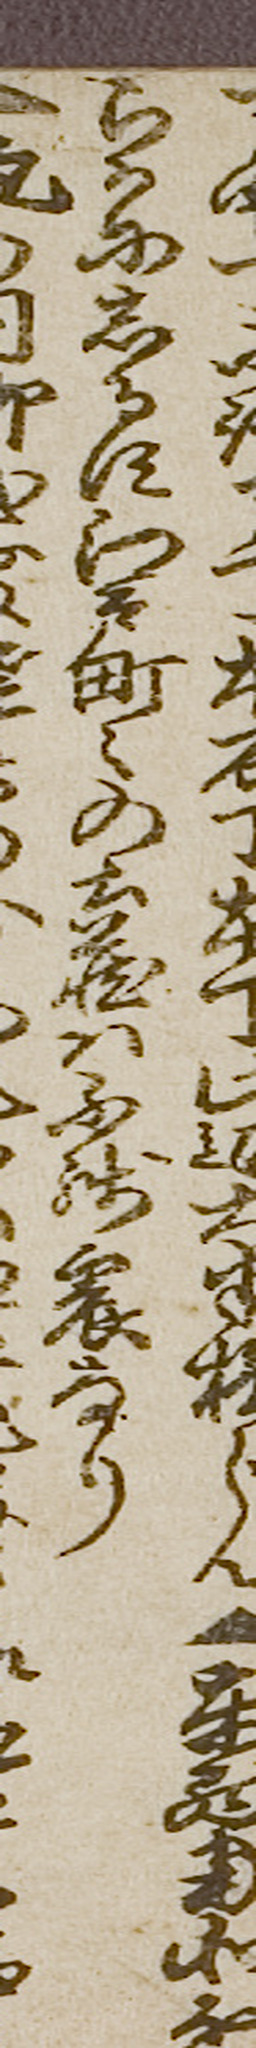らかにしるす江戸町々の土蔵は不残震なり
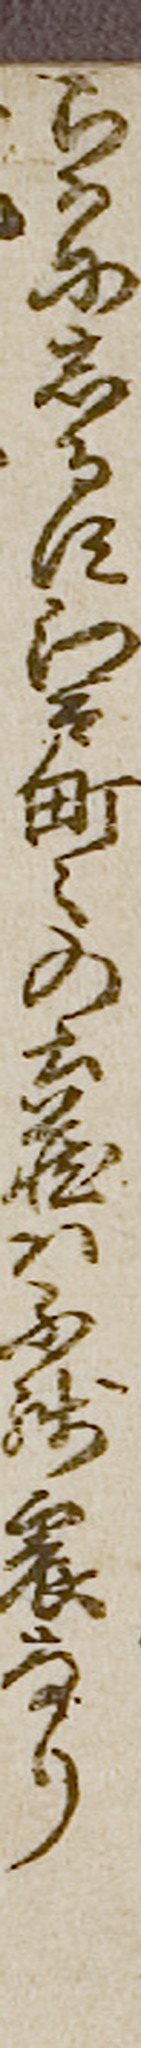らかにしるす江戸町々の土蔵は不残震なり
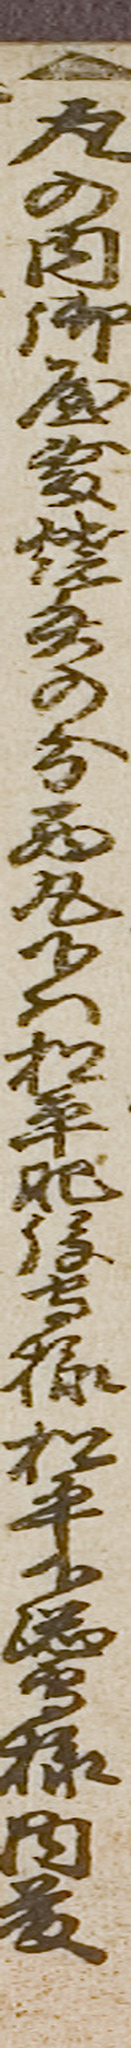▲丸の内御屋敷焼失の分西丸下は松平肥後守様松平下総守様内藤
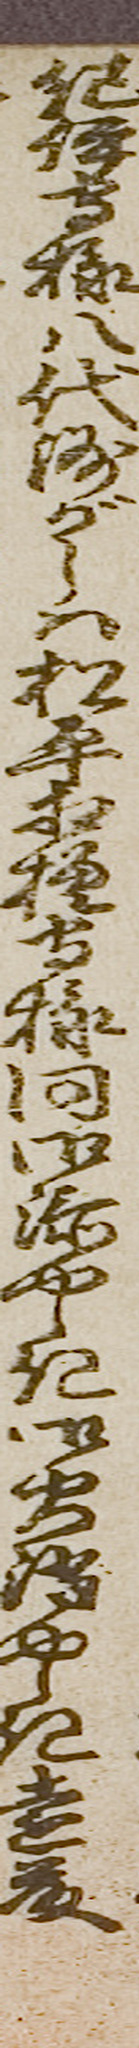紀伊守様八代洲がしは松平相模守様同御添やしき御火消やしき遠藤
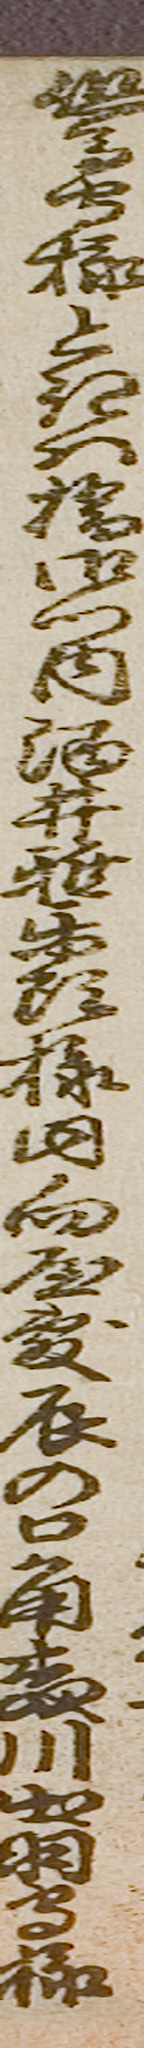但馬守様ときは橋御門内酒井雅楽頭様同向屋敷辰の口角森川出羽守様
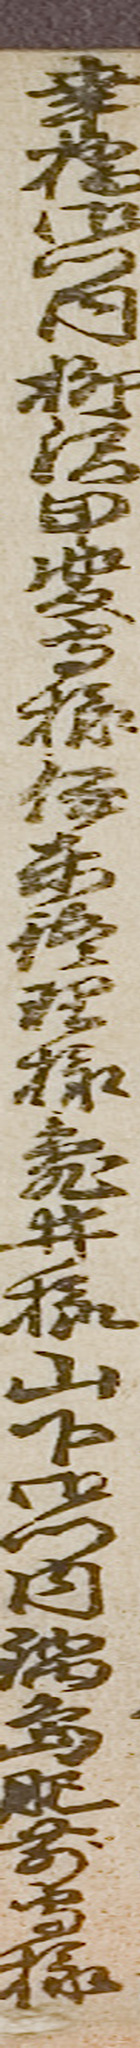幸橋御門内柳沢甲斐守様伊東修理様亀井様山下御門内鍋島肥前守様
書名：[安政地震状況図]
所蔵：東京大学総合図書館 General Library in the University of Tokyo, JAPAN
